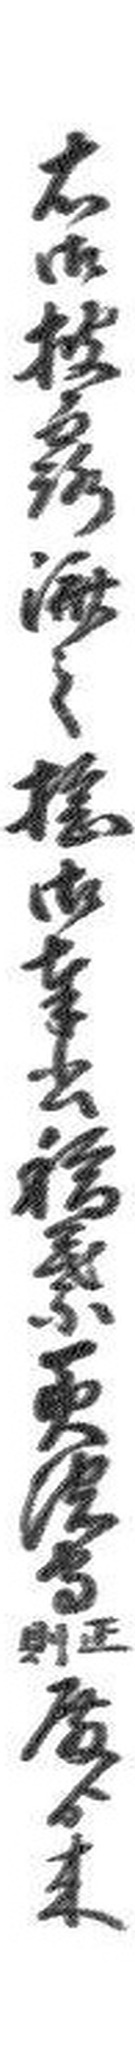右御披露済之捻御奉書稲葉美濃守正則殿ゟ来
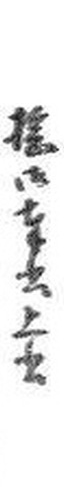捻御奉書上書
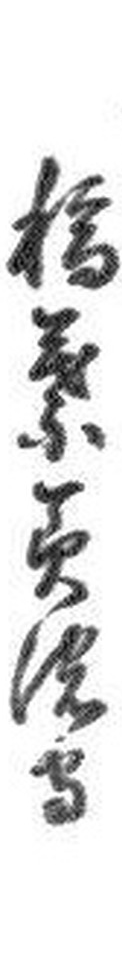稲葉美濃守
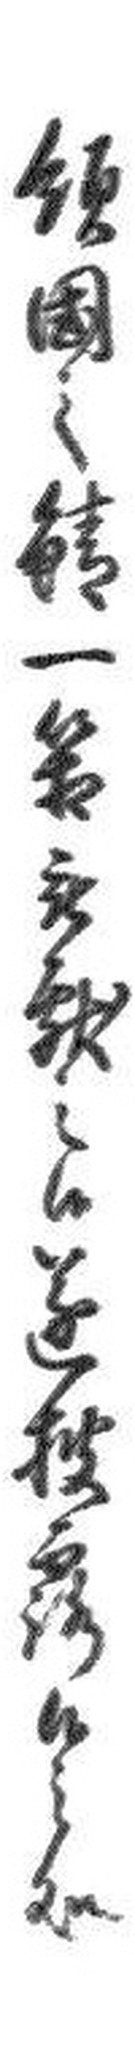領国之鯖一箱被献之候遂披露候之処
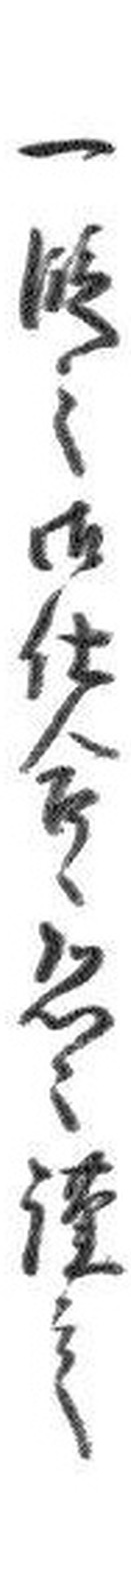一段之御仕合候恐々謹言
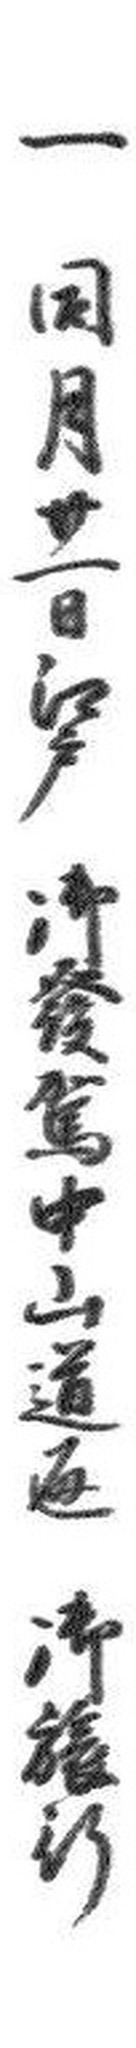一同月廿一日江戸御発駕中山道通御旅行

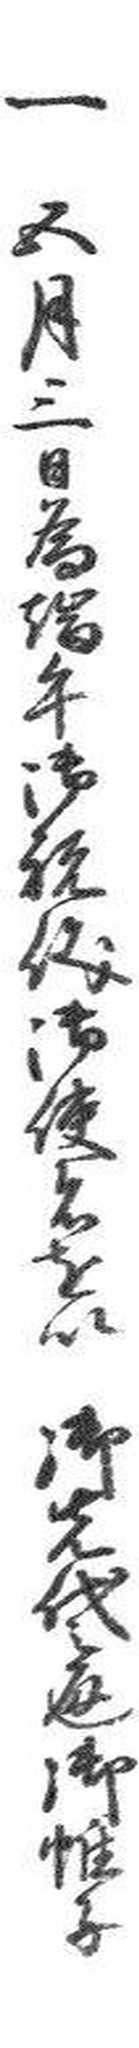一五月三日為端午御祝儀御使者を以御先代之通御帷子
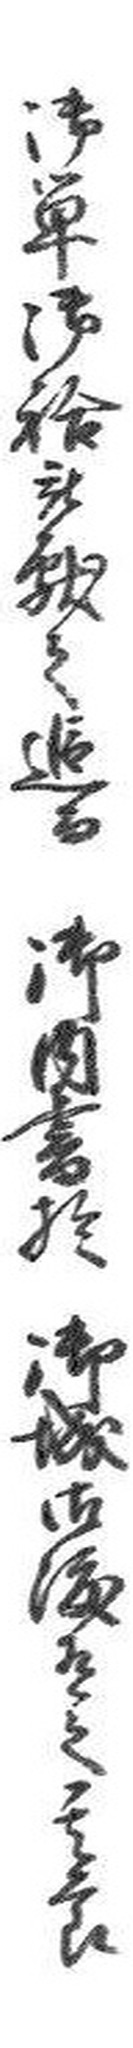御単御袷被献之追而御内書於御城御渡有之其節
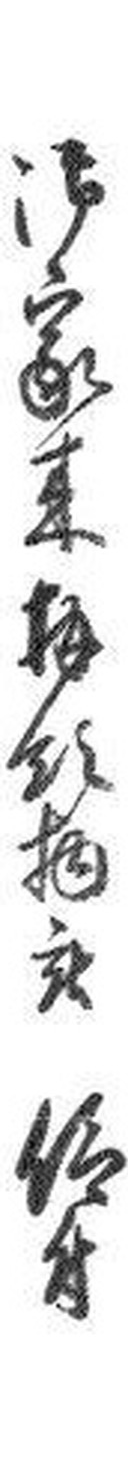御家来拝領物被仰付
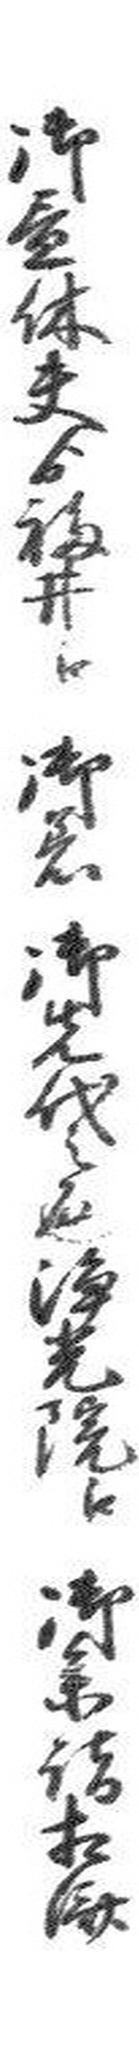御昼休夫ゟ福井江御着御先代之通浄光院江御参詣相済
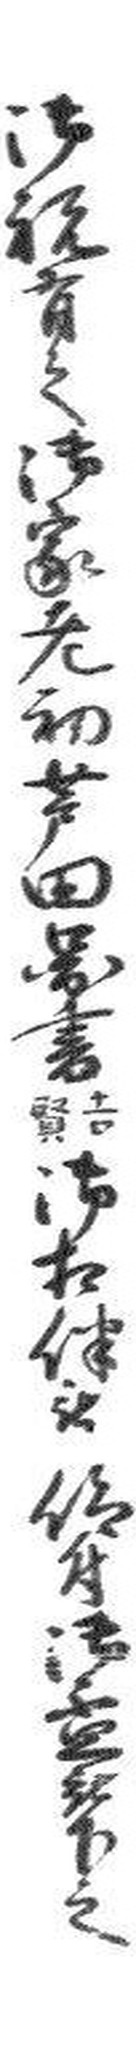御祝有之御家老初芦田図書吉賢御相伴被仰付御盃被下之
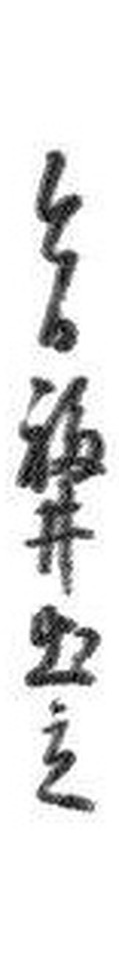今日福井出立
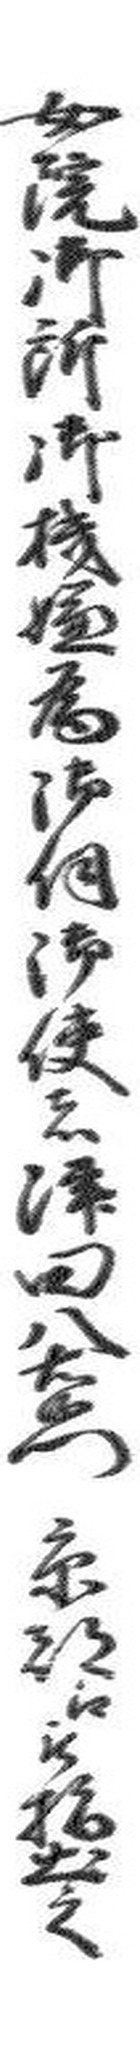女院御所御機嫌為御伺御使者津田八右衛門京都江被指出之
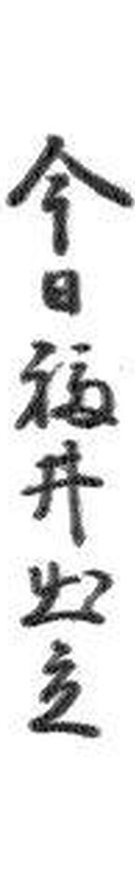今日福井出立
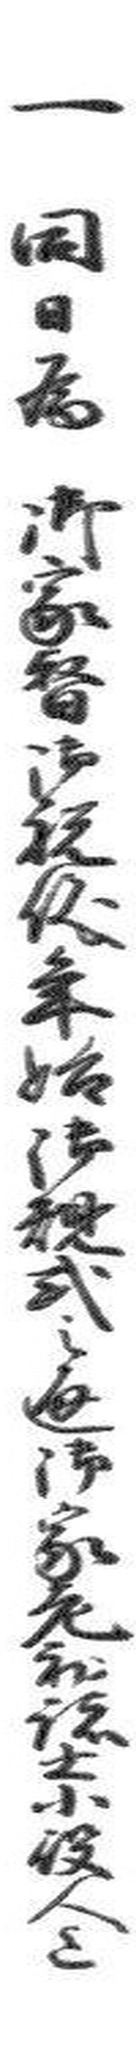一同日為御家督御祝儀年始御規式之通御家老初諸士小役人迄
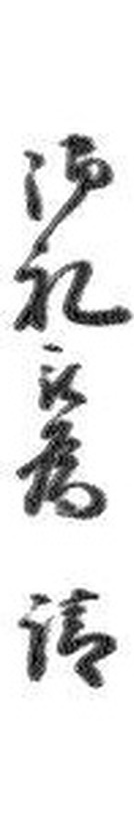御礼被為請
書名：家譜 十一 昌親公 従延宝二年到延宝四年八月
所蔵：福井県文書館 Fukui Prefectural Archives
